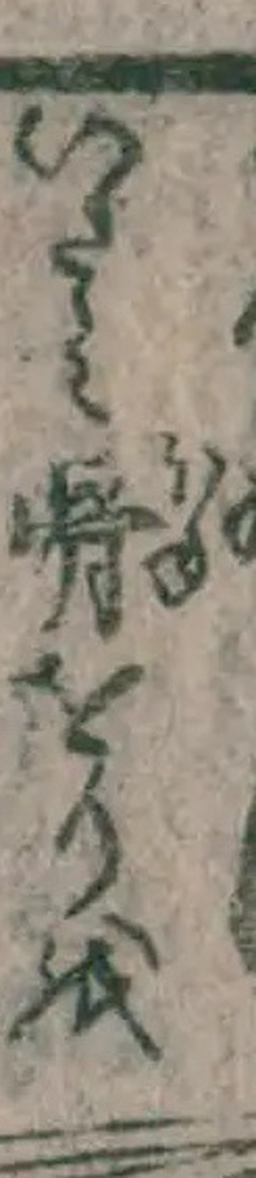いたみ骨をりを
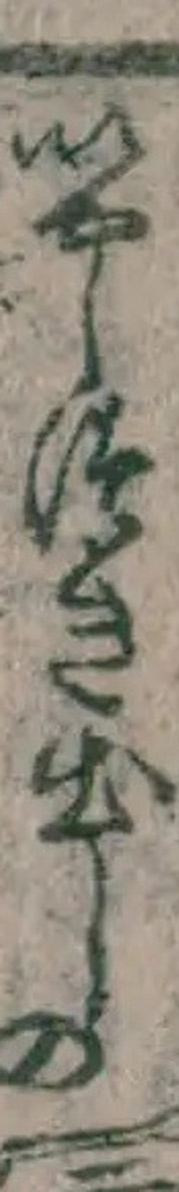いやしつき出しの
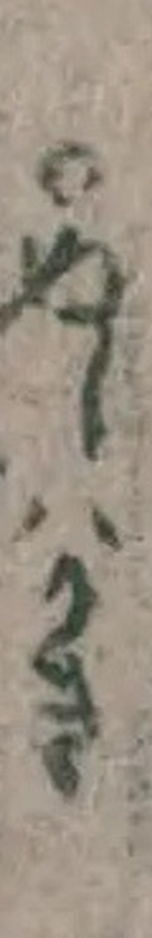○ぬしはかき
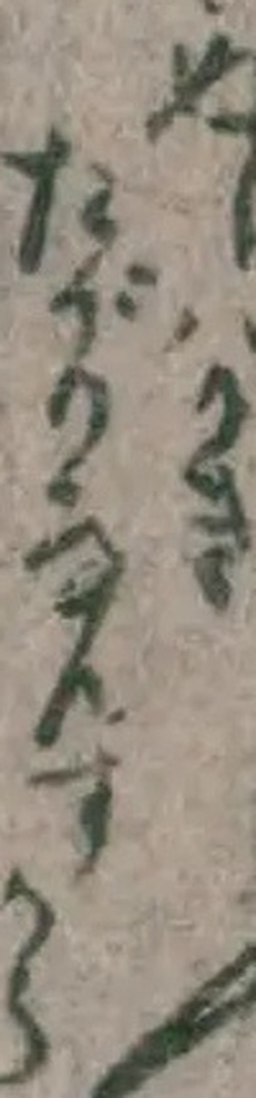たがりなんすから
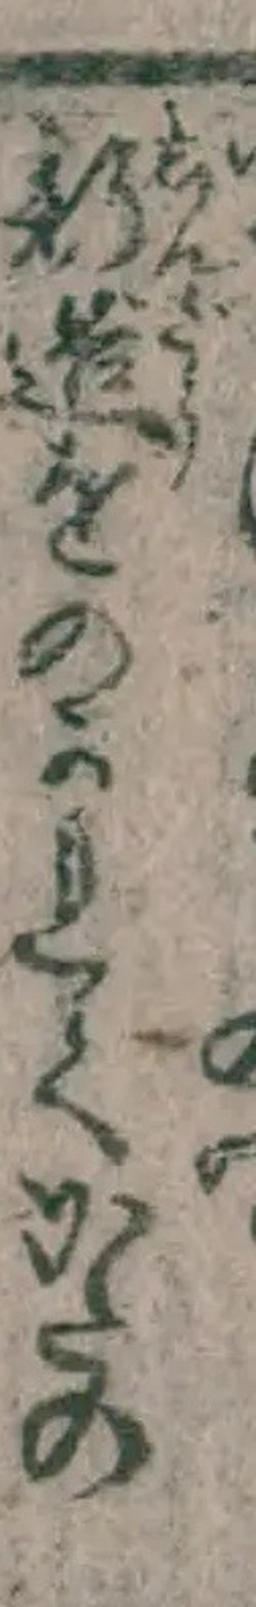新造をのかれてかたの
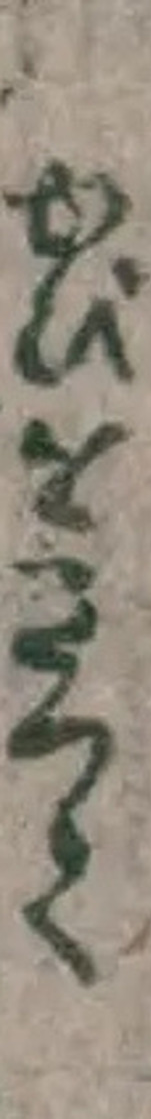ゆびをきつて
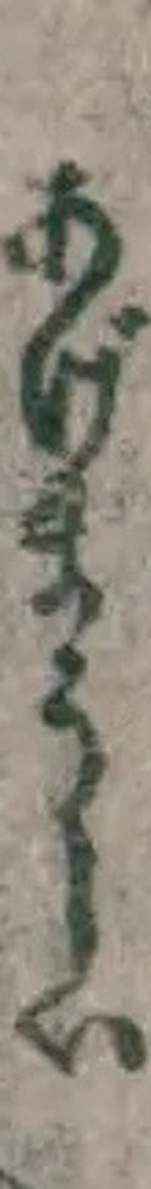あげまうしいす
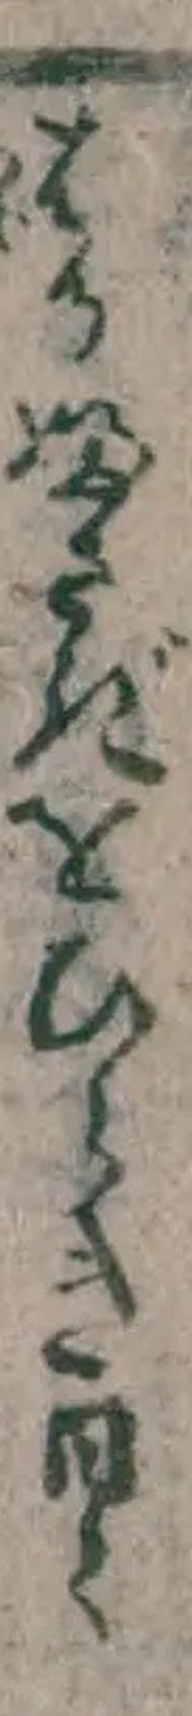はふさぎをひらき日々
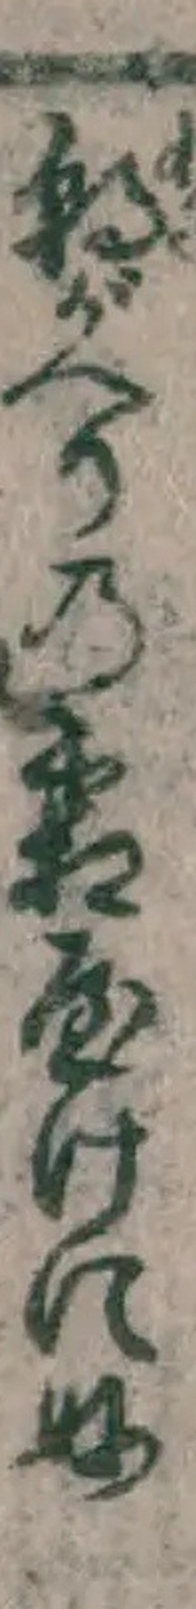朝がへりの霜やけに妙
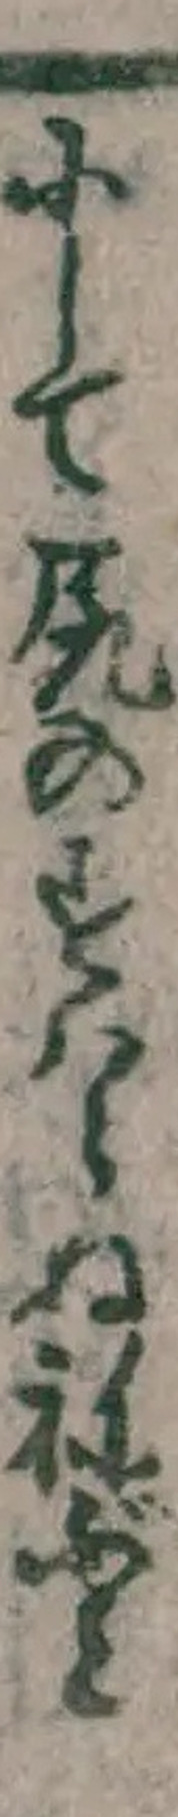にして尻のすはらぬねぶと
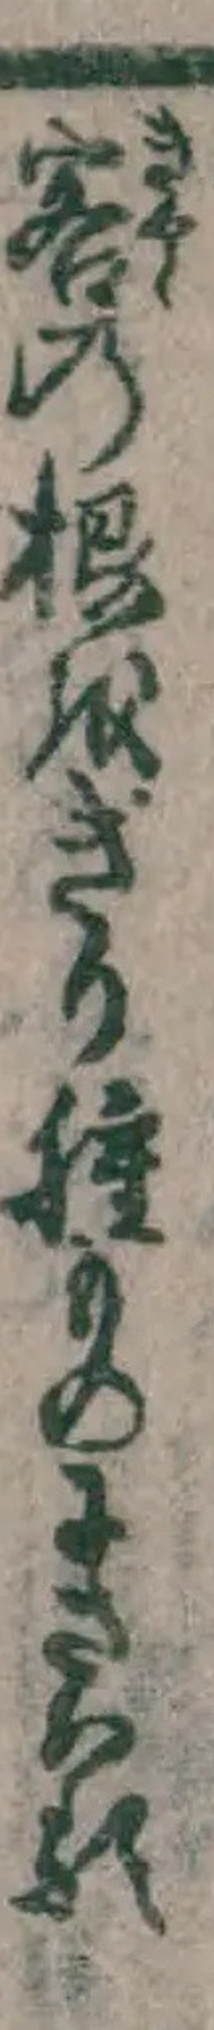客の根をきり種ものにさはる
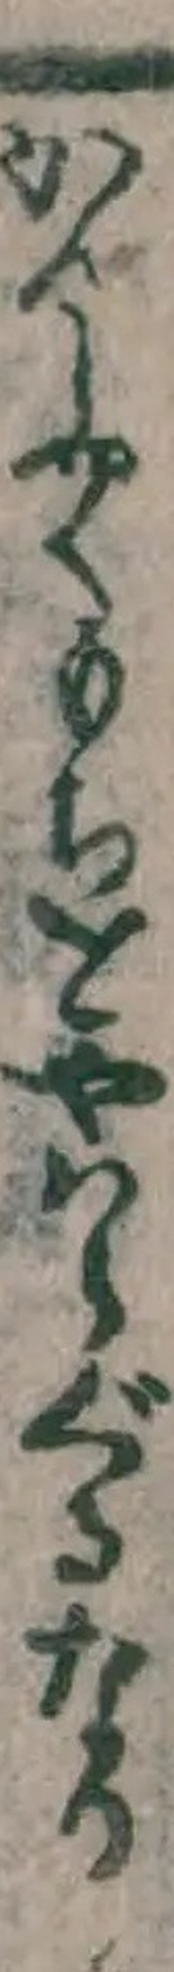かんしやくもちをやはらぐるなり
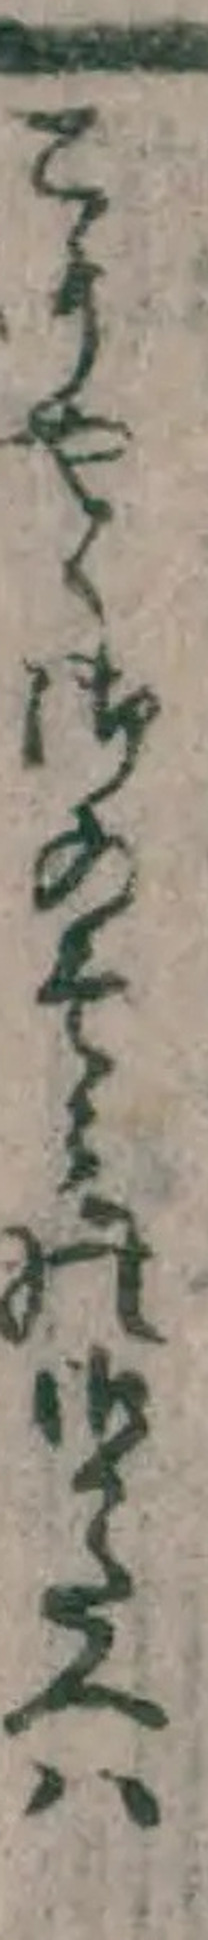こうやく御のそみの御かたへは
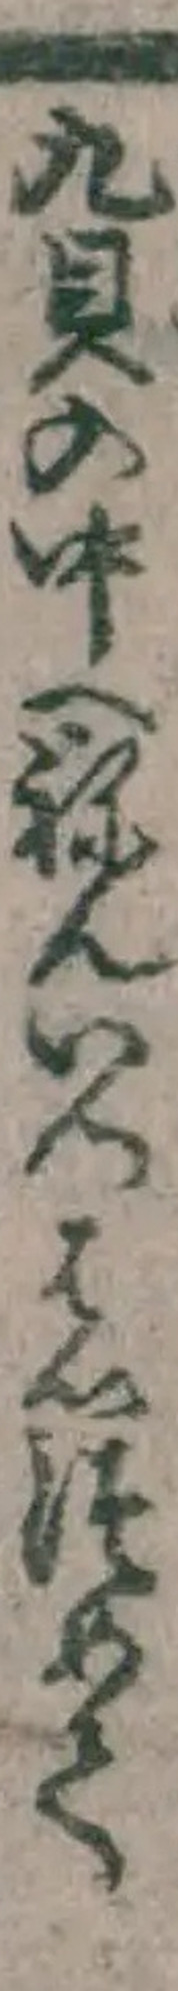九貝の中へねんいつはいつめて
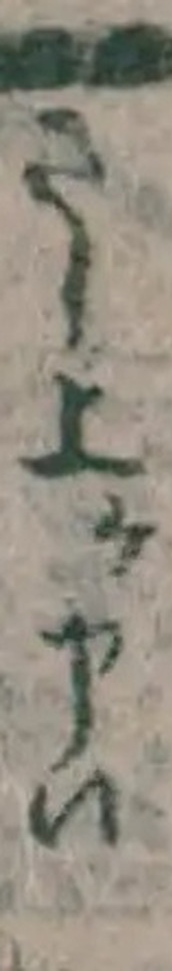さし上申候
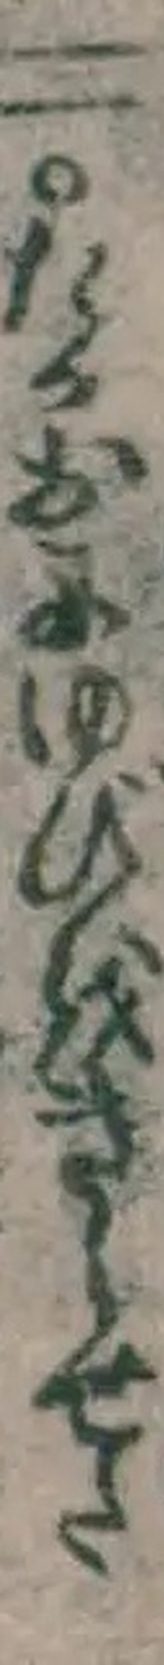○たかおにゆびをきらせた
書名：視薬霞報条 3巻
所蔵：国立国会図書館 National Diet Library, JAPAN
